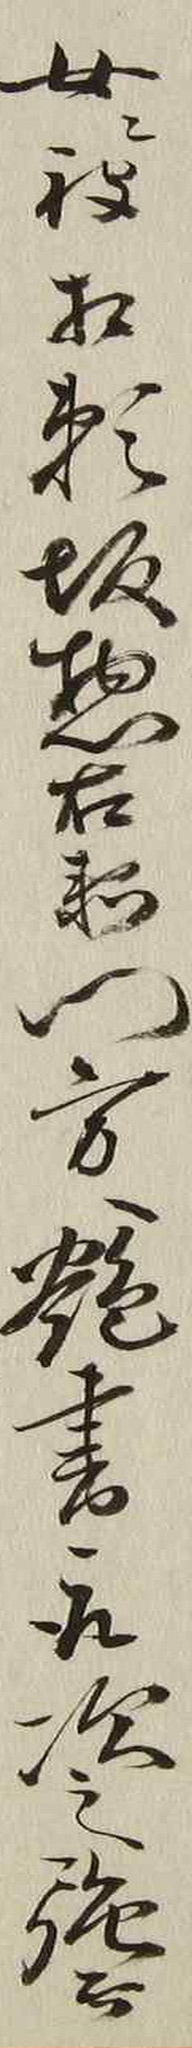女ニ被相頼坂惣右衛門方ㇸ艶書取次之強而
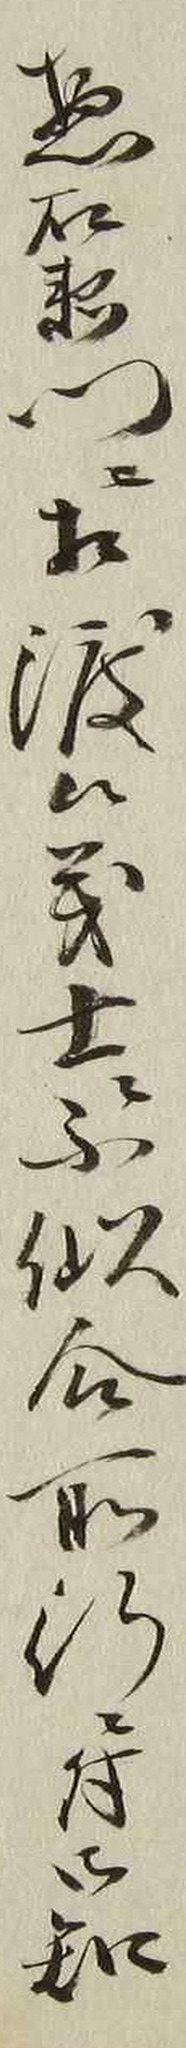惣左衛門ニ相渡候義士ニ不似合所行ニ付御知
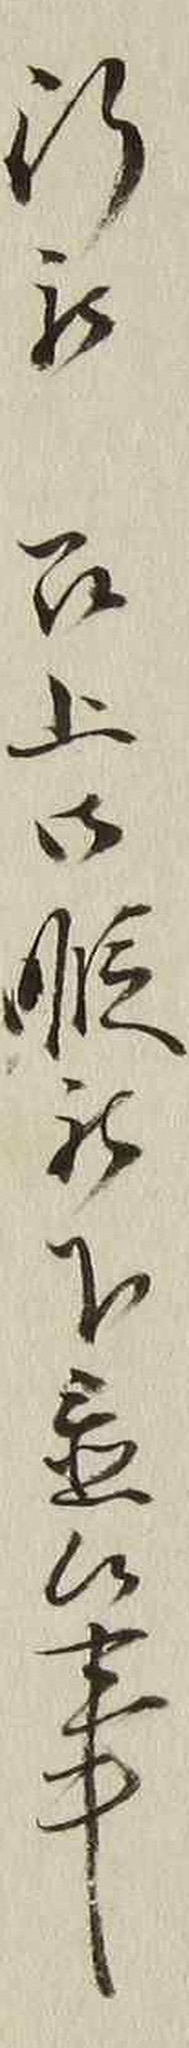行被召上御暇被下置候事
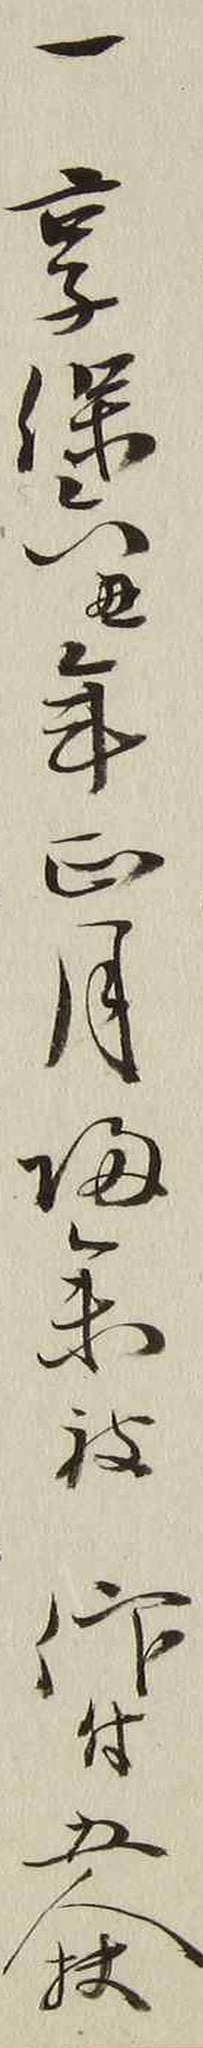一享保六丑年正月帰参被仰付五人扶
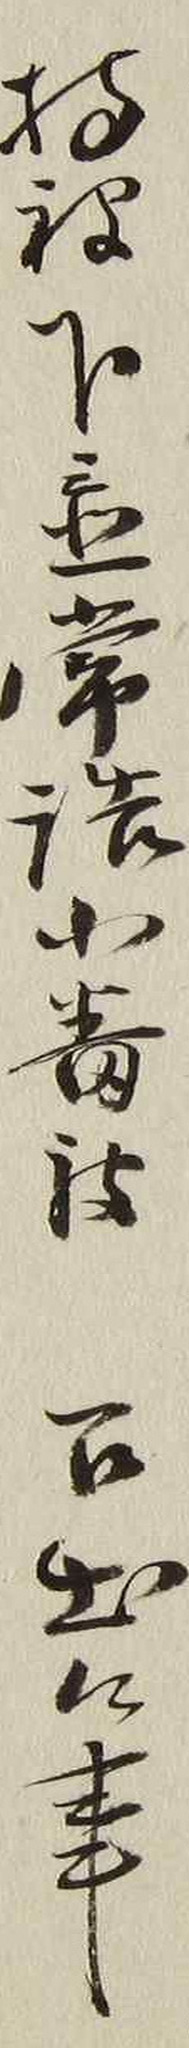持被下置常詰小番被召出候事
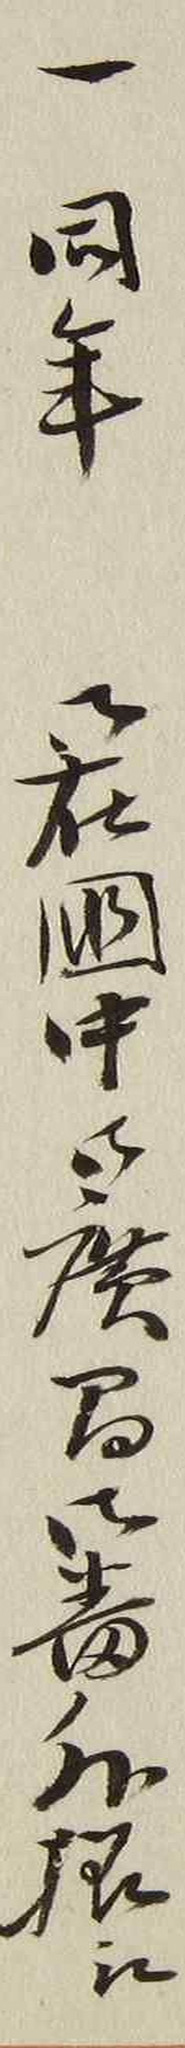一同年御在国中御広間御番外様え
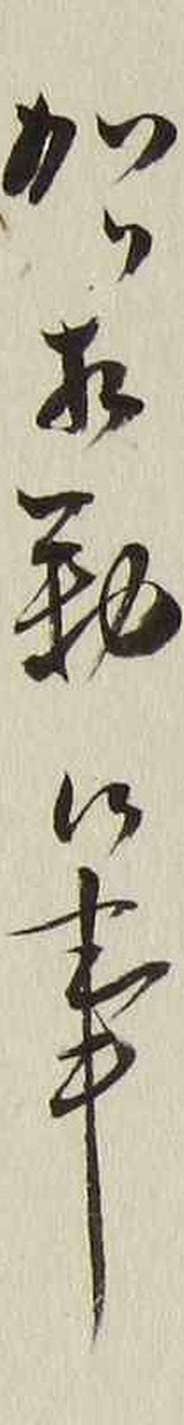加り相勤候事
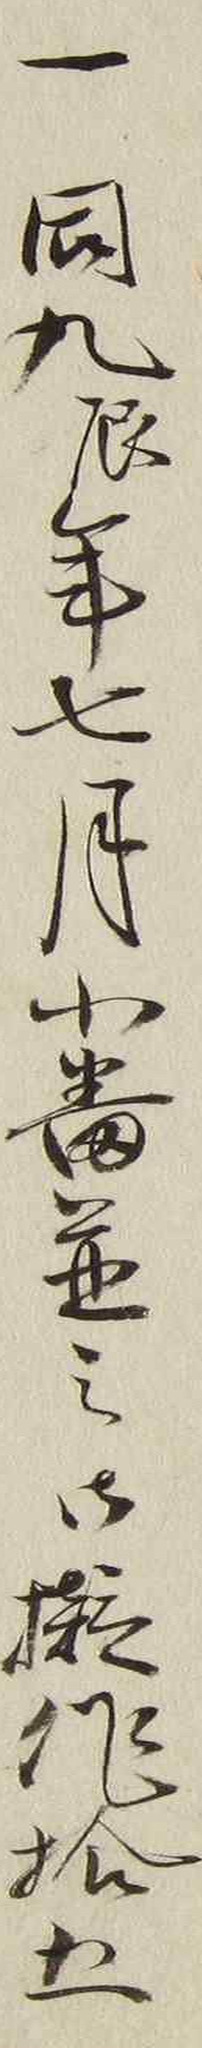一同九辰年七月御番並之御擬作拾五
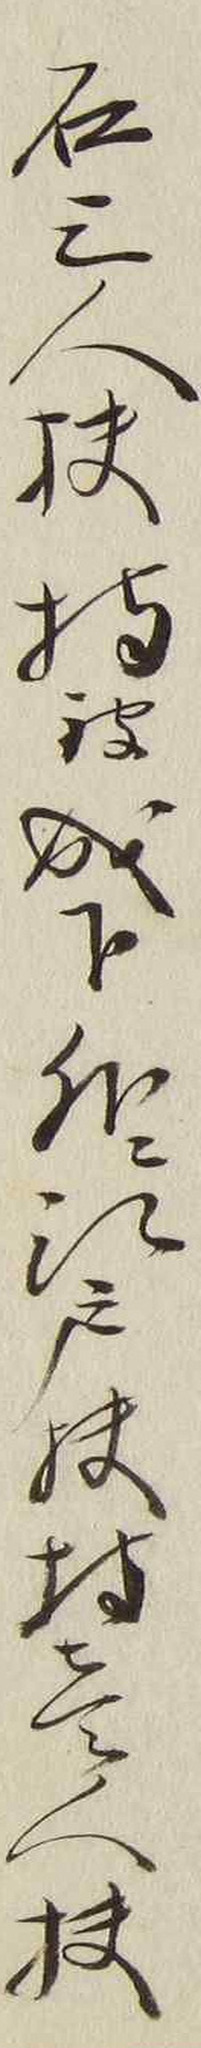石三人扶持被成下外ニ江戸扶持壱人扶

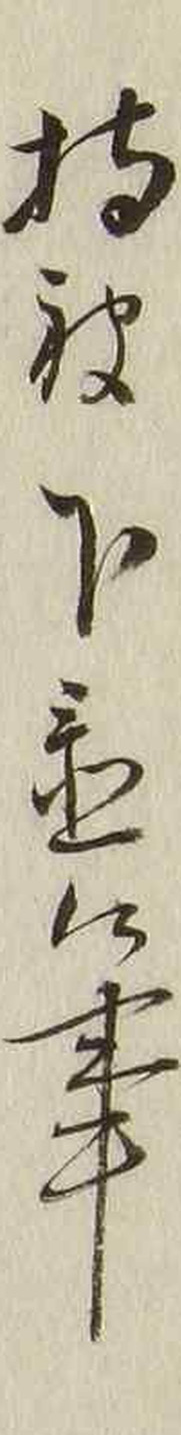持被下置候事
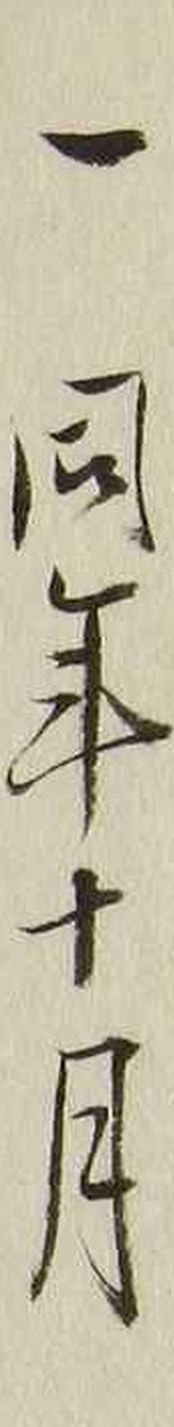一同年十月
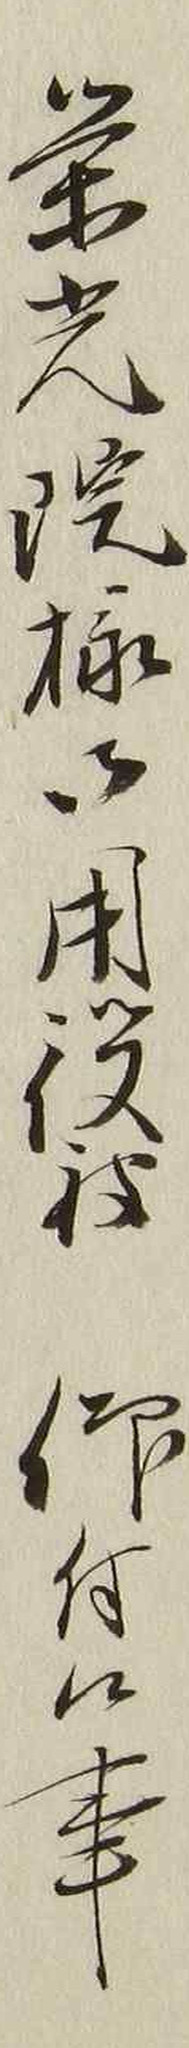栄光院様御用役被仰付候事
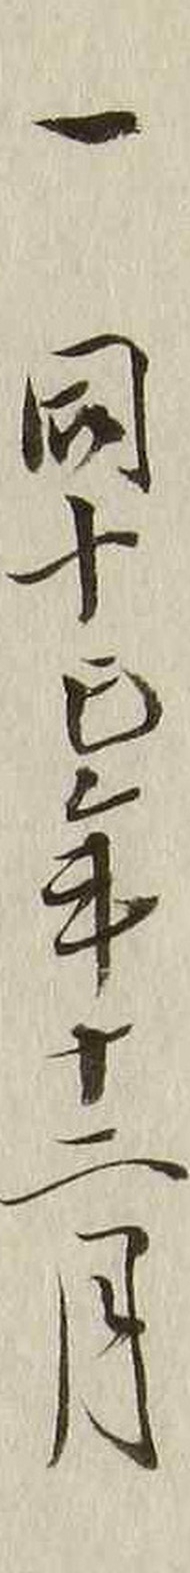一同十巳年十二月
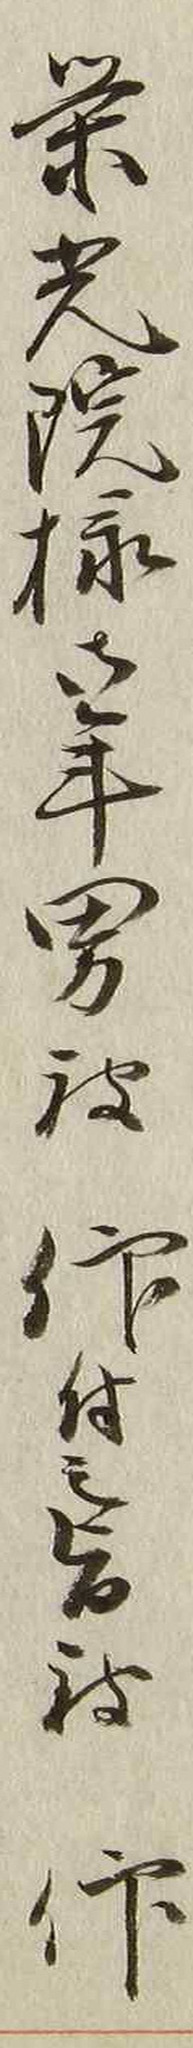栄光院様御年男被仰付之旨被仰
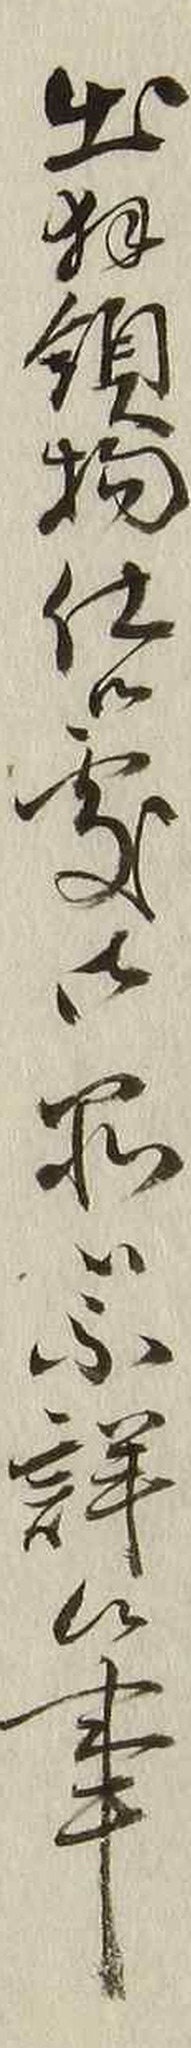出拝領物仕候処御品は不詳候事
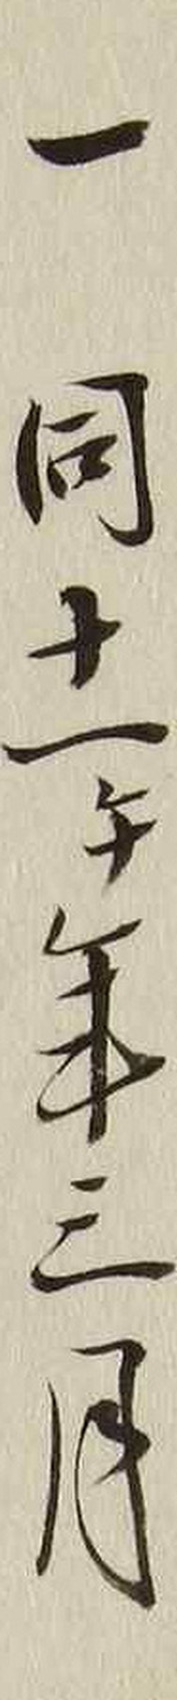一同十一午年三月
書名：諸士系譜　巻之163　な之部5
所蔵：会津若松市立会津図書館
